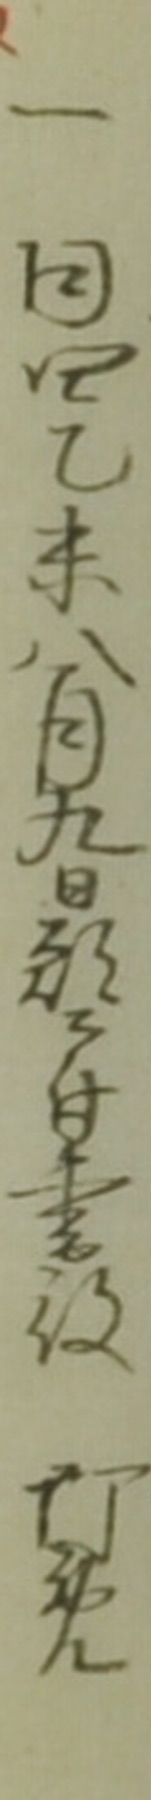一同四乙八月九日願ニ付書役御免

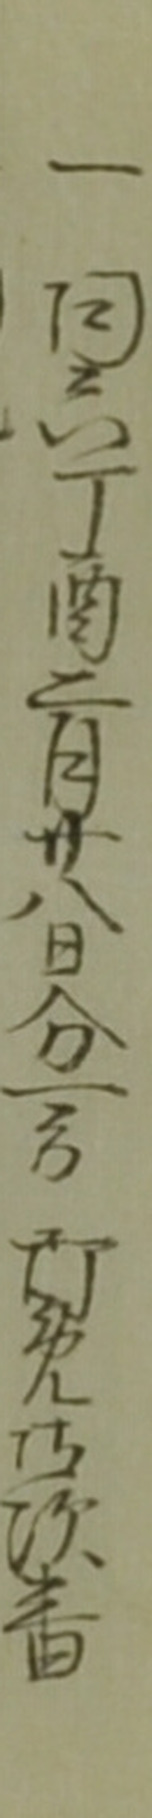一同六丁酉二月廿八日分一方御免御次番
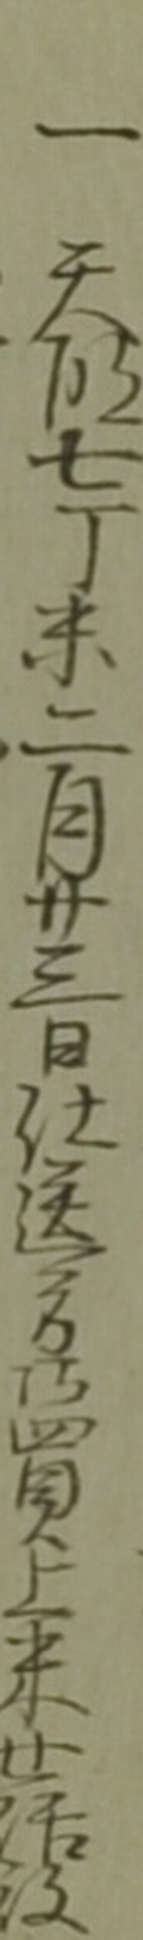一天明七丁未二月廿三日仕送方御買上米世話役
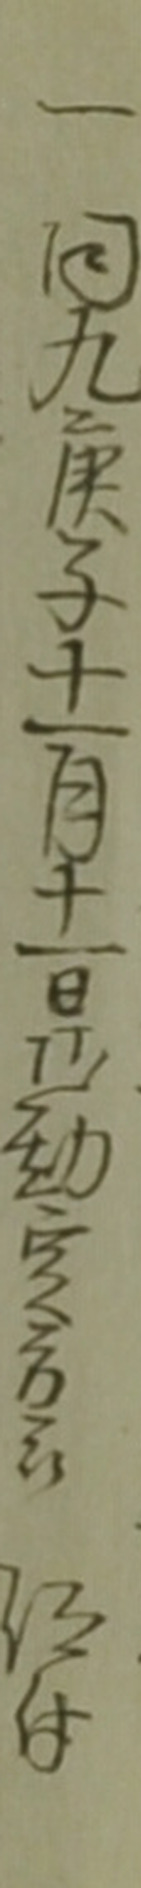一同九庚子十一月十一日御勘定方被仰付
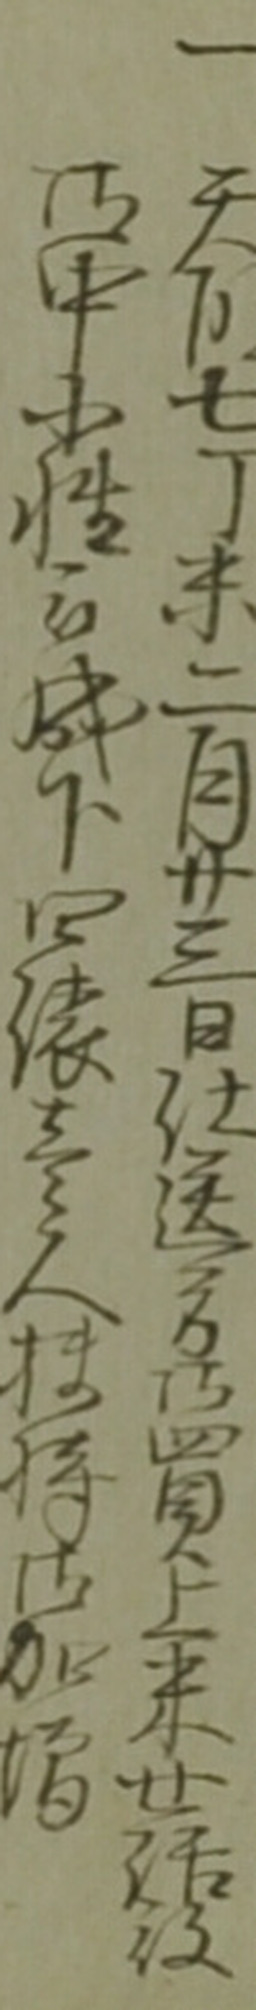御中小性被成下四俵壱人扶持御加増
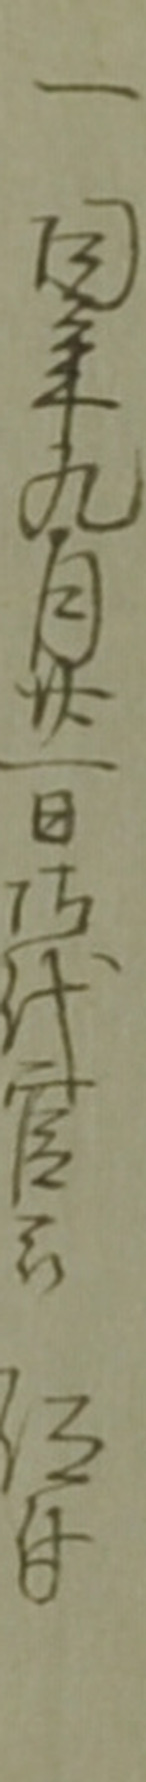一同年九月廿一日御代官被仰付
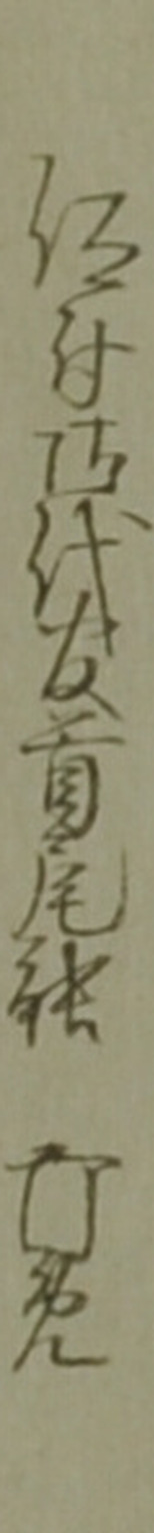仰付御代官首尾能御免
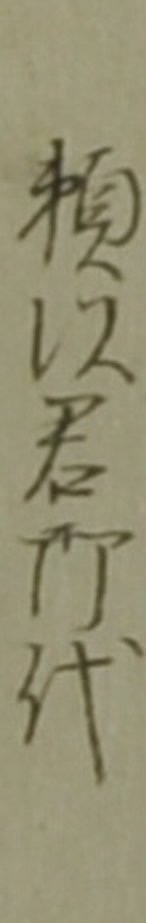頼以君御代
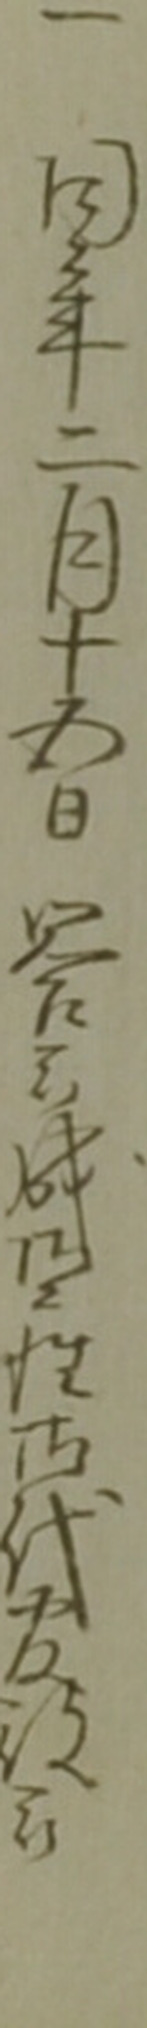一同年二月十五日思召被成御座御代官役被
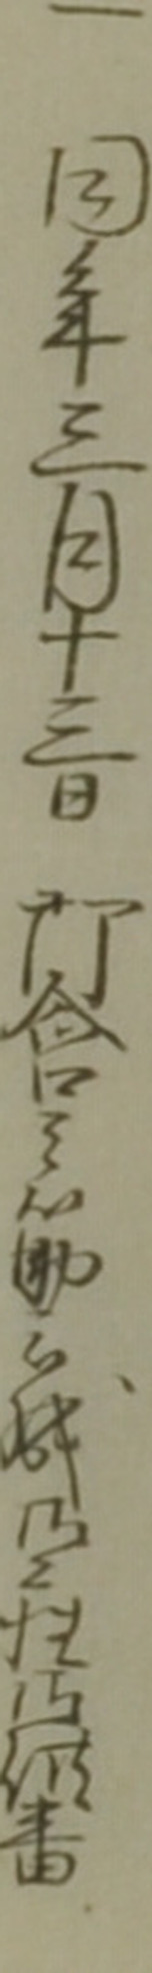一同年三月十三日御含之筋被成御座御供番
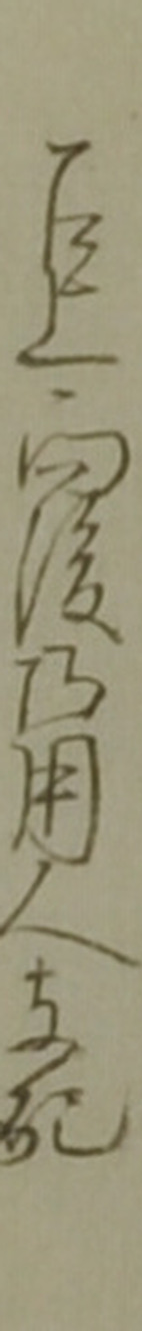召上向後御用人支配
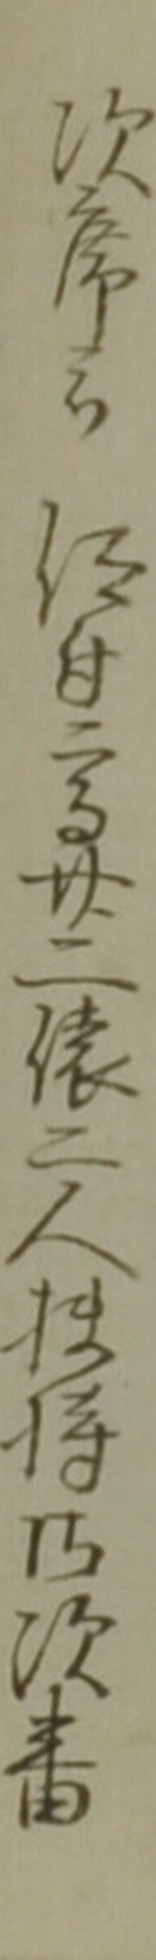次席被仰付高廿二俵二人扶持御次番
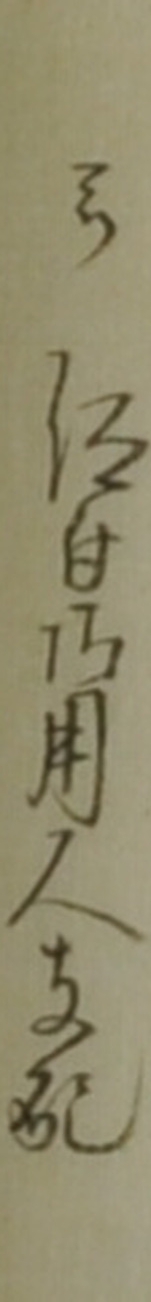被仰付御用人支配
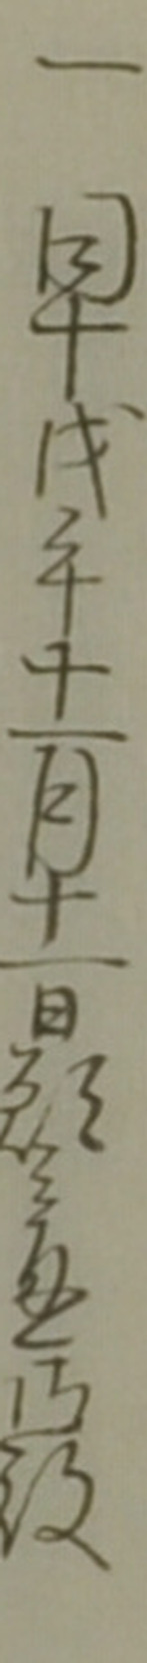一同十戊午十一月十一日願之通御役
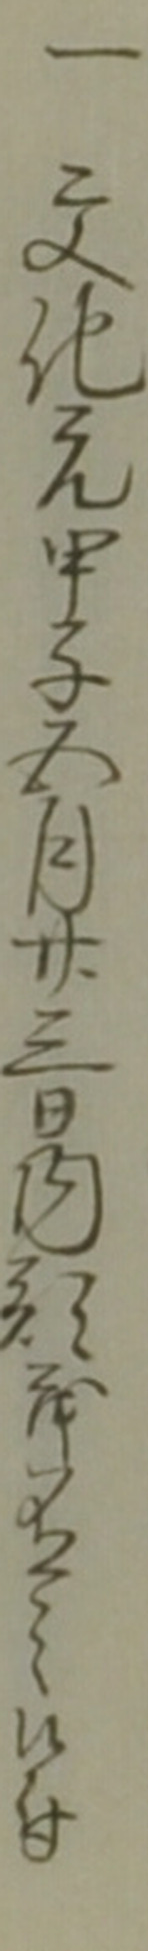一文化元甲子五月廿三日内願茂有之候付
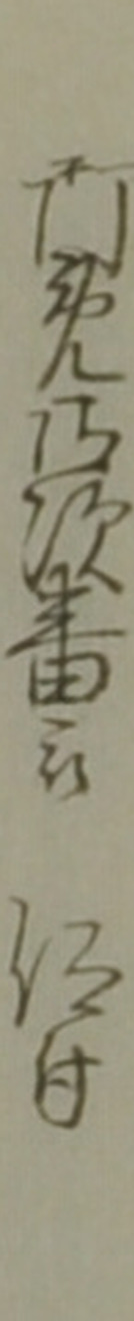御免御次番被仰付
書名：無足諸士勤仕録（二）
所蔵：伊那市立高遠町図書館・合同会社AMANE
